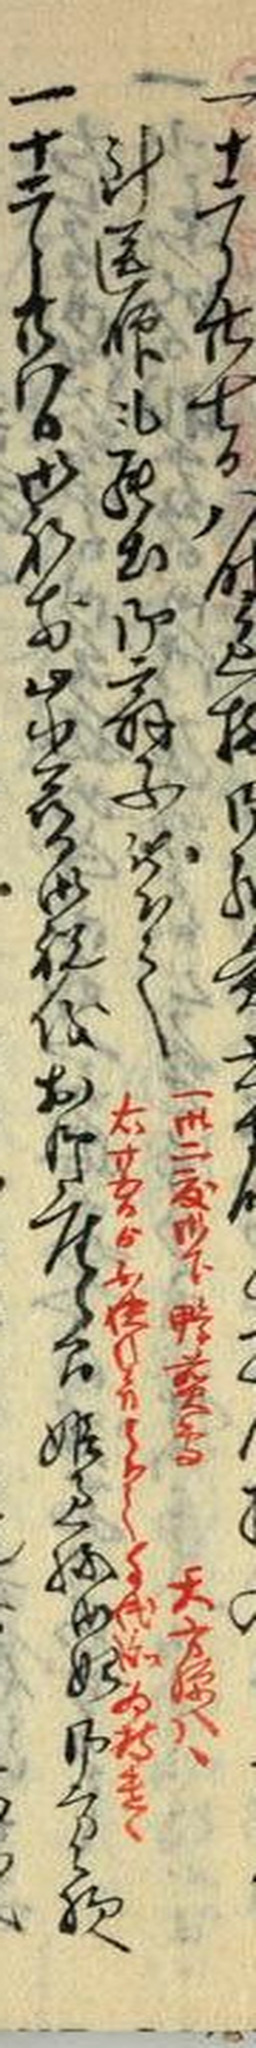一十二月廿八日御礼前歳暮御祝儀於御座之間姫君様御始御方々様
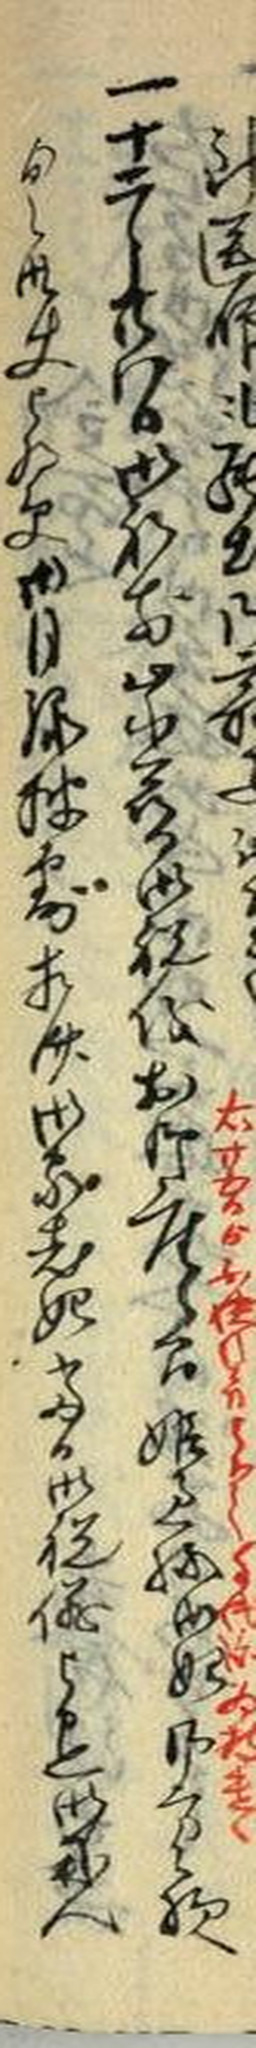ゟ之御使被為受御目録披露相済御家老始当日御祝儀被申上御用人
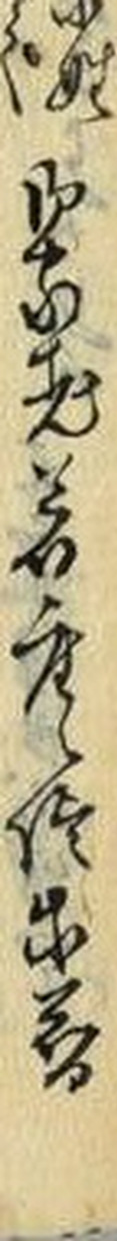役之御家老着座之儘歳暮
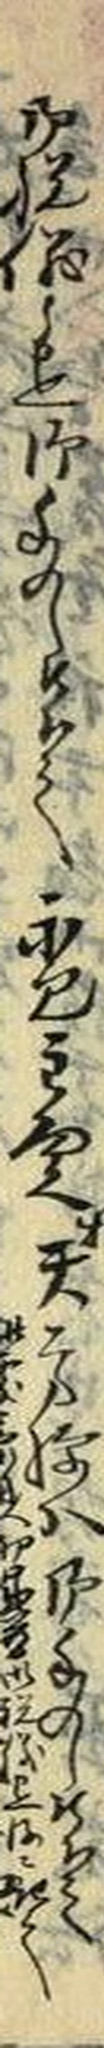御祝儀被申上御手のし被下之永見主殿煩天方孫八御手のし被下之
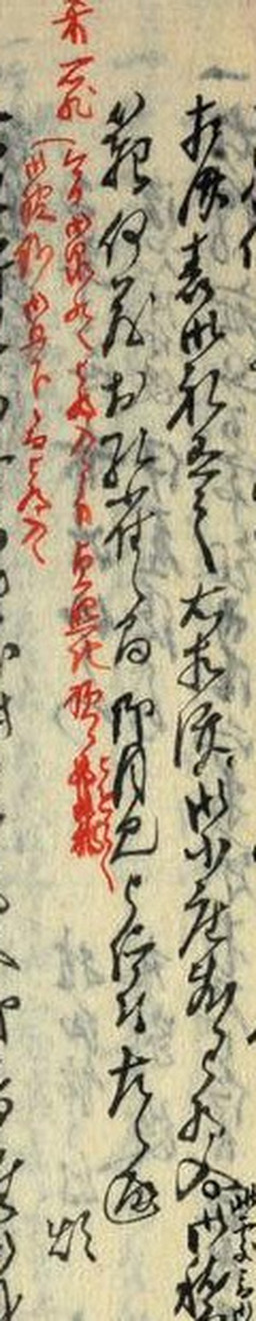範何茂於孔雀之間御目見被仰付左之通
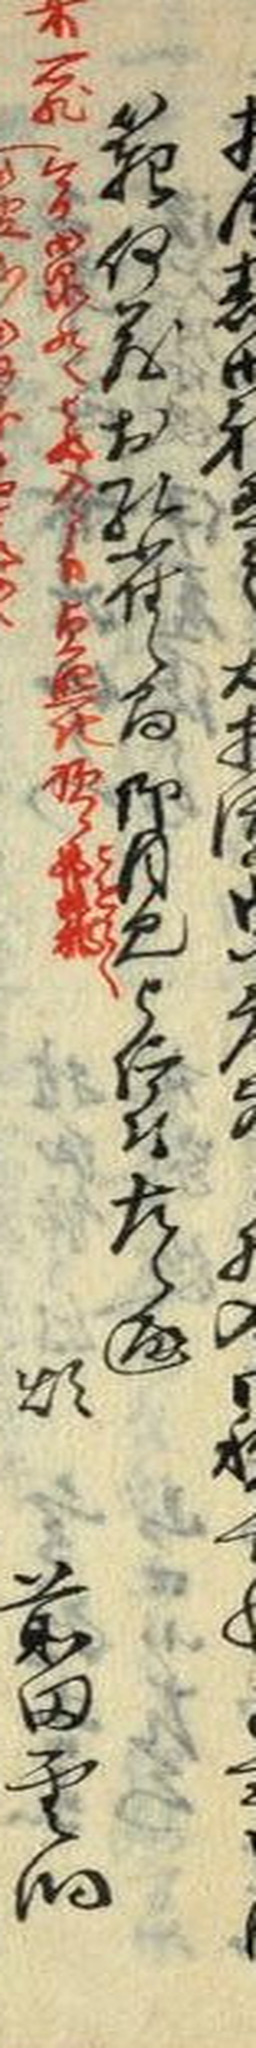一十二月廿五日
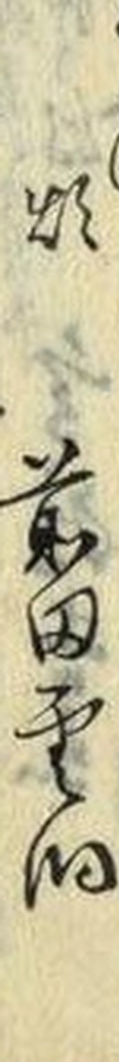煩前田雲洞
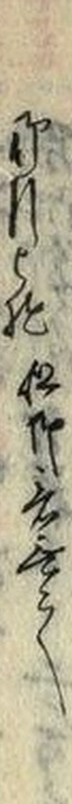御引被遊但御意無之
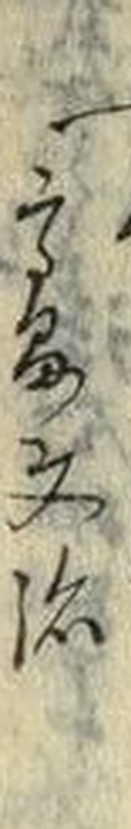高畠文弥
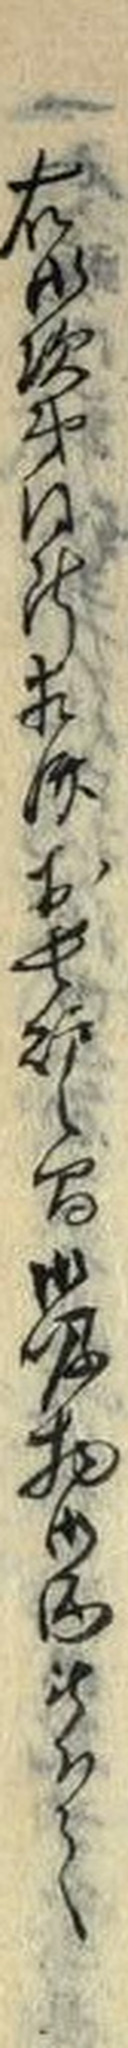右御次第同断相済於長炉之間御吸物御酒被下之

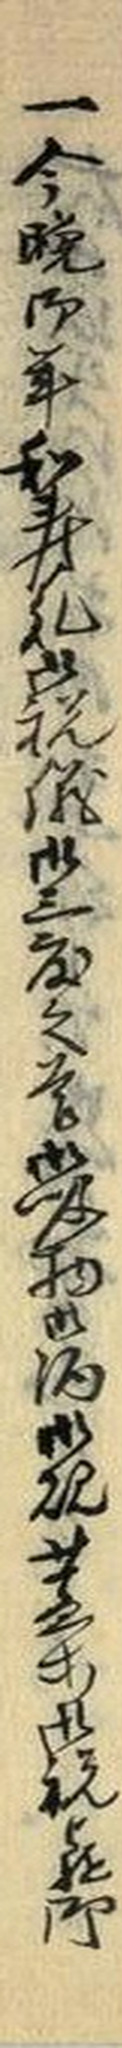一今晩御年和寿礼御祝儀御三度之節御吸物御酒御硯蓋等御祝被遊御
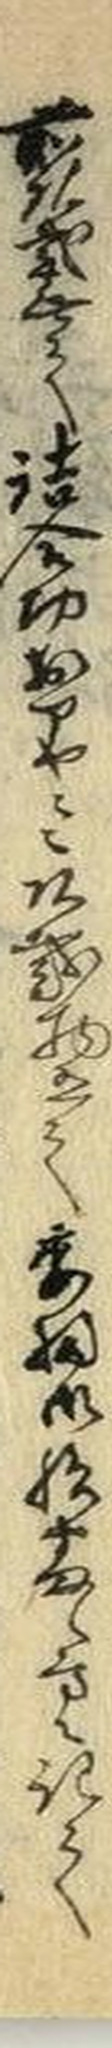前頂戴無之詰合切於部や〳〵ニ頂戴物有之委細御膳番之方へ記之
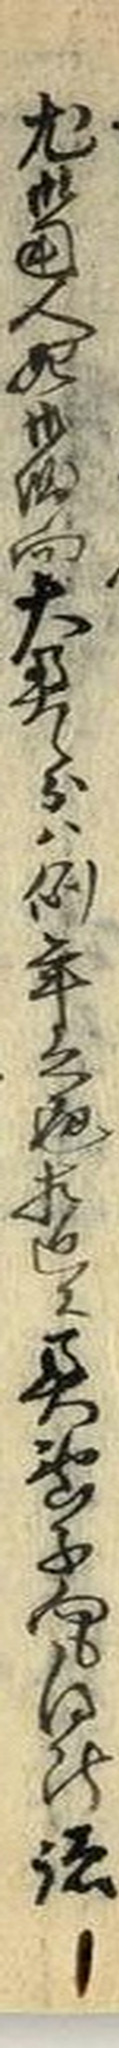尤御用人始御側向大奥之分ハ例年之通相廻ス奥台子向も同断謙
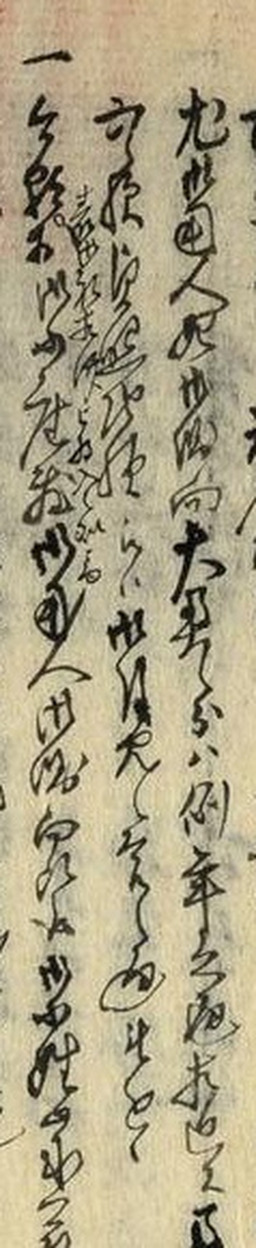五郎様貞照院様江ハ御月見之節之通被進候
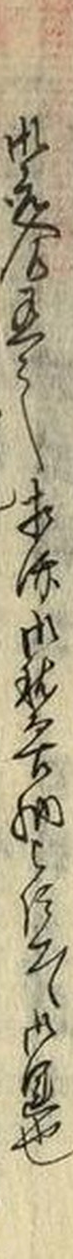御取合有之相済御稽古納被仰出候御運也
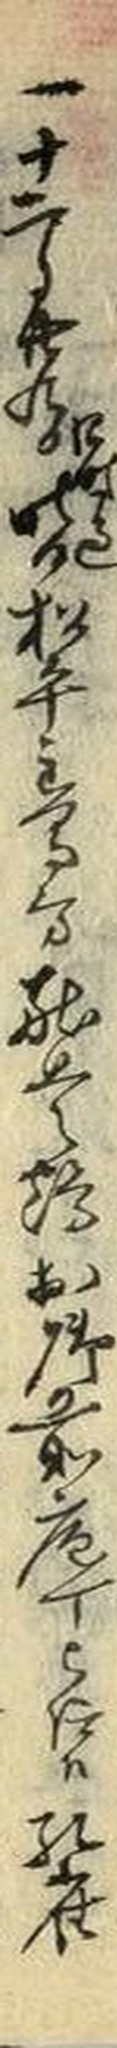一十二月廿九日四時過昨日松平主馬方献上之鶴於御前庖丁被仰付孔雀
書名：少傅日録抄（斉承付側向頭取日記、在国）
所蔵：福井県文書館 Fukui Prefectural Archives
